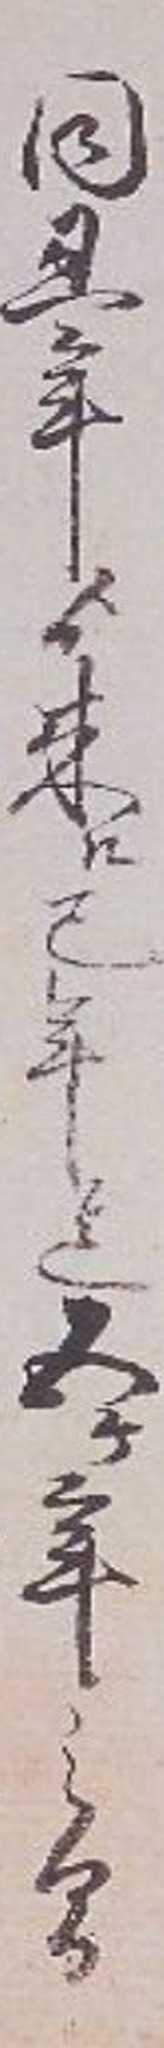同丑年ゟ来る巳年迠五ヶ年之間
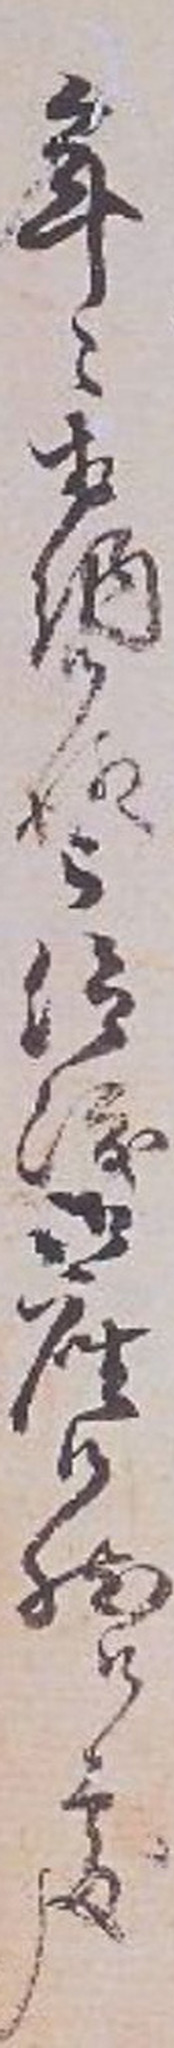年々相納候様被仰渡御座候然る處

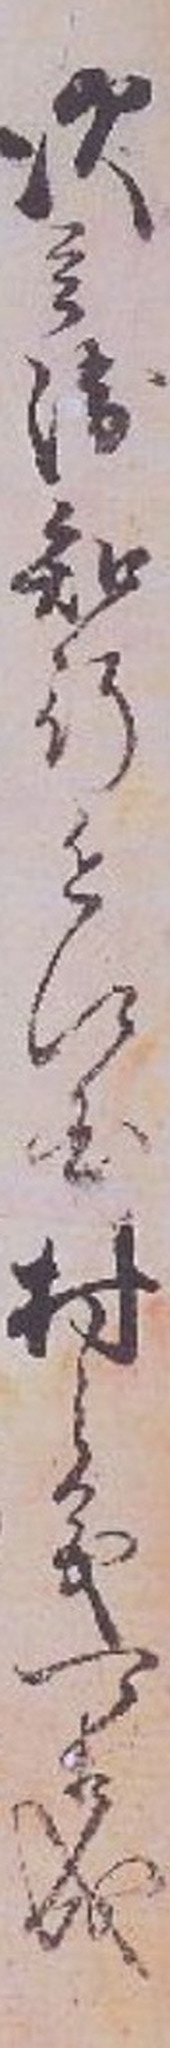次兵衛知行近江国村之義可相成
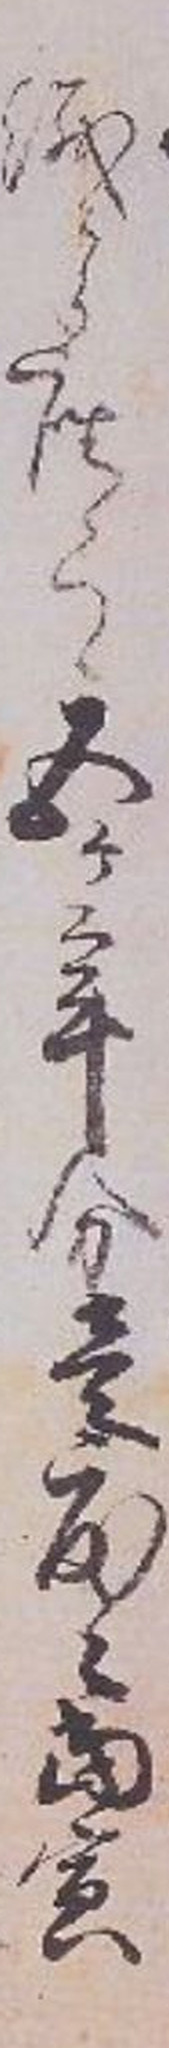儀に御座候はゝ五ヶ年分壱反に当寅
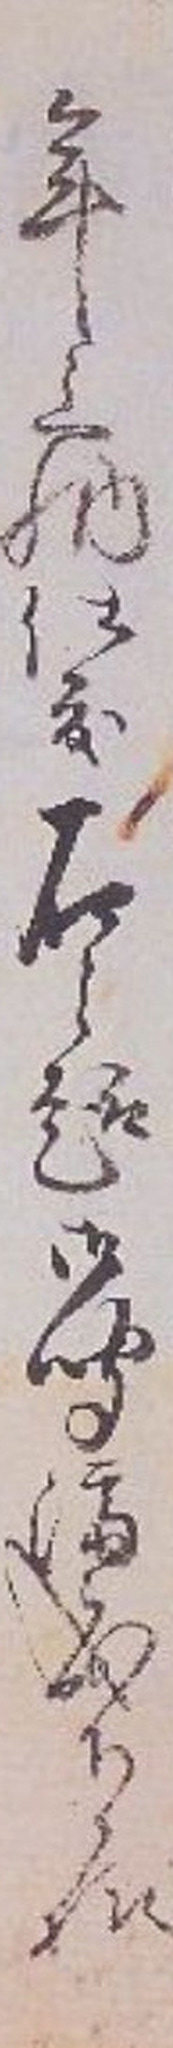年上納仕義右之趣御聞済被成下候様
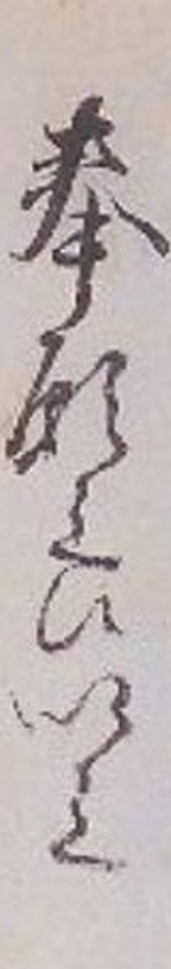奉願上候以上
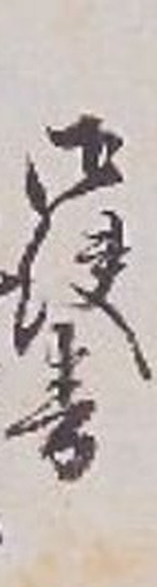御使番
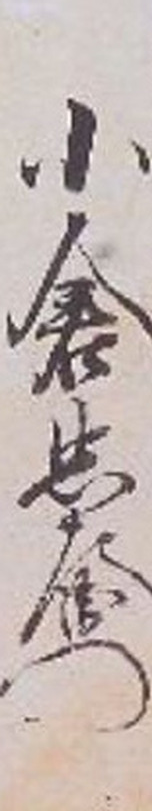小倉忠左衛門
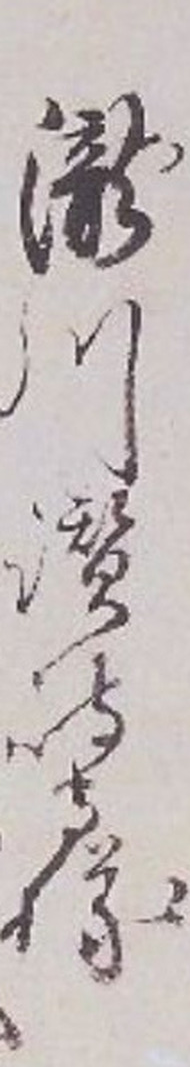瀧川讃岐守様
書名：琉球人帰国に付国役金の記録
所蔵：University of the Ryukyus Library
